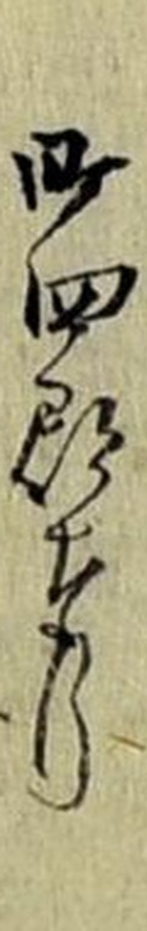町四郡奉行
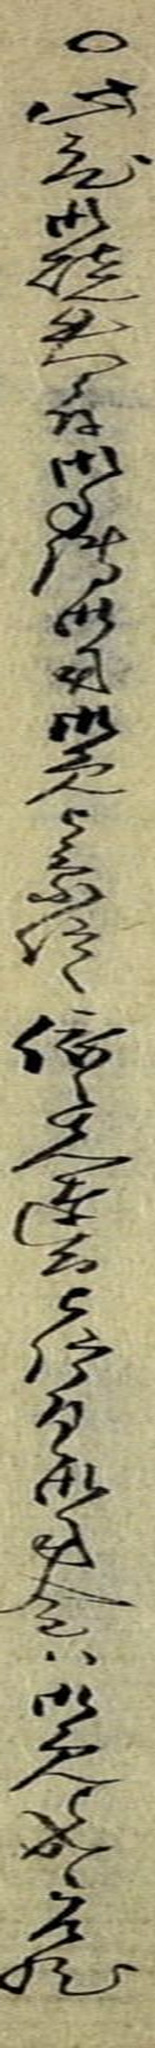○此度御焼失に付御手伝御用御免被蒙仰候依之先達而被仰付候御用金は御免被成候乍然
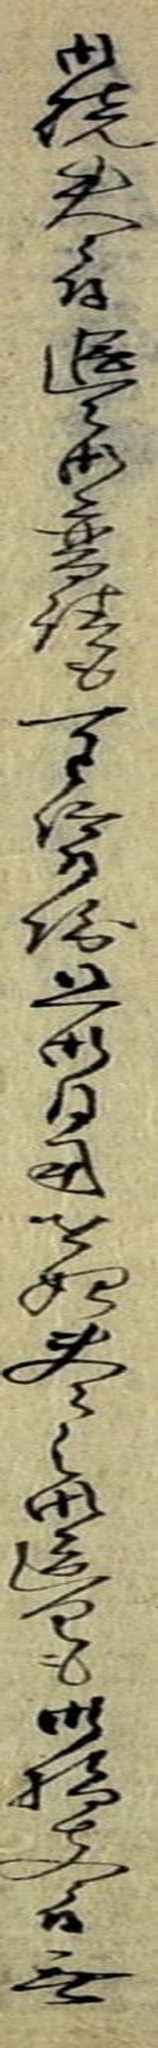御焼失に付追々御普請も可被仰付儀且御日用を始夫々之御道具も御指支に付無
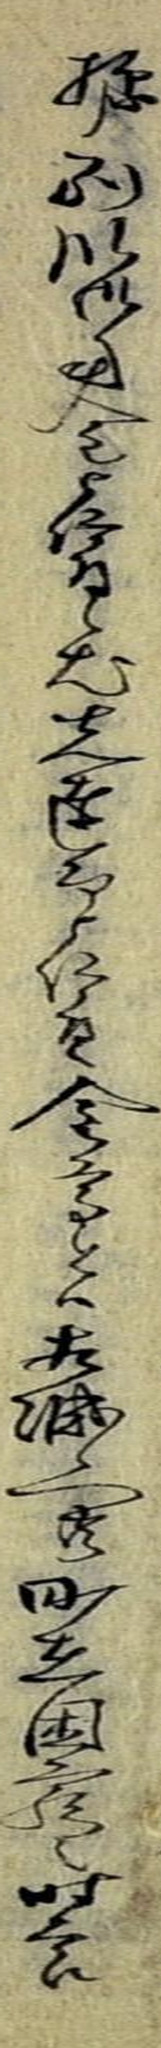拠別段御用金被仰付候尤先達而被仰付候金高とは相減候へ共町在困窮之時節
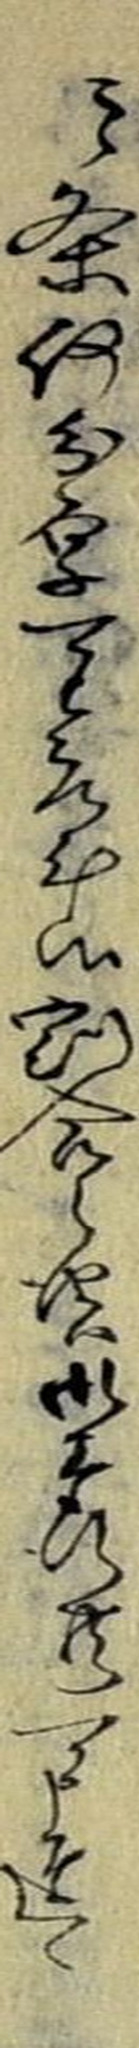に候条何分厚可被取斗候割合之儀は御奉行共可申達候
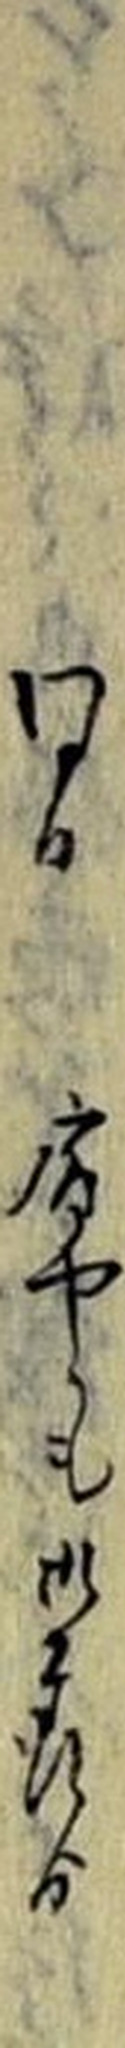同日府中へも御奉行ゟ
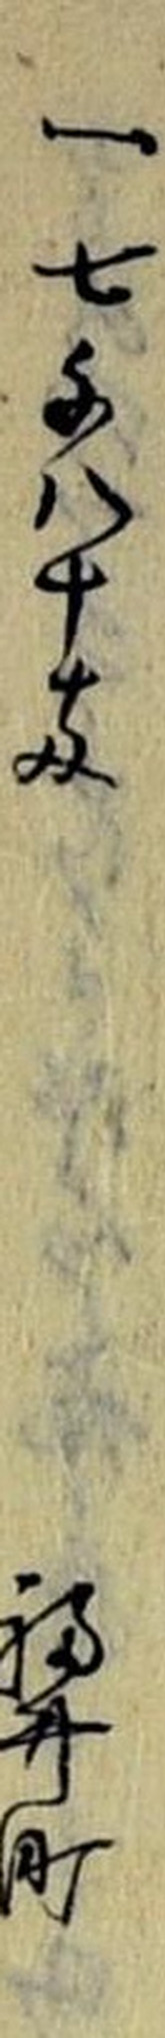一七千八十両福井町
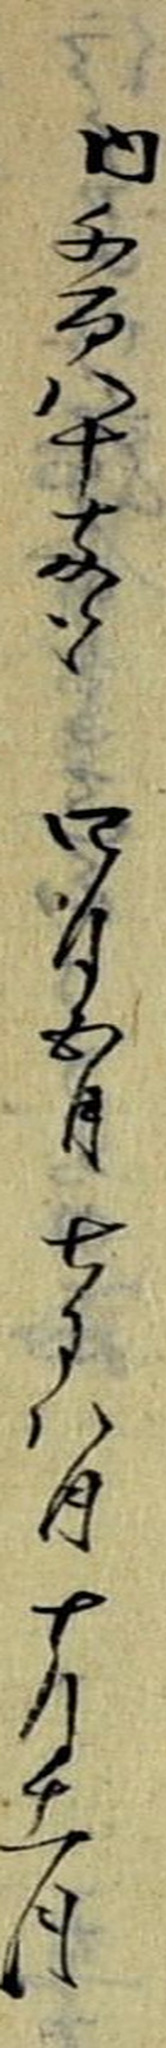内千百八十両つヽ四月五月七月八月十月十一月
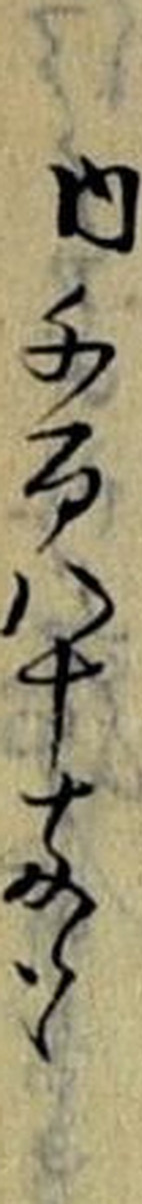一弐千九百八十両上領
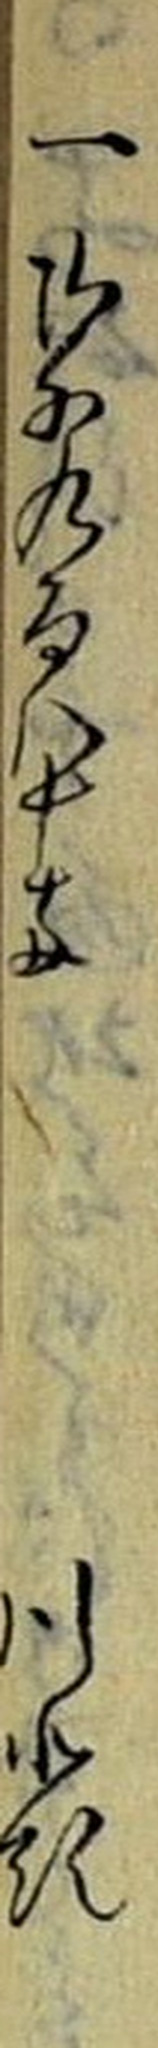一弐千九百八十両川北領
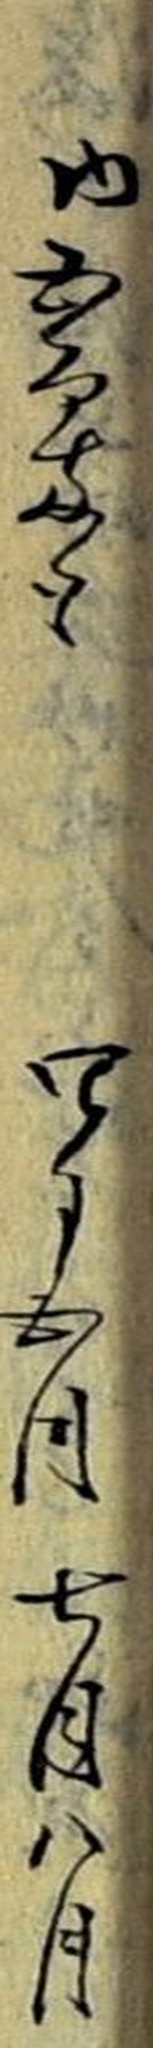内五百両つヽ四月五月七月八月
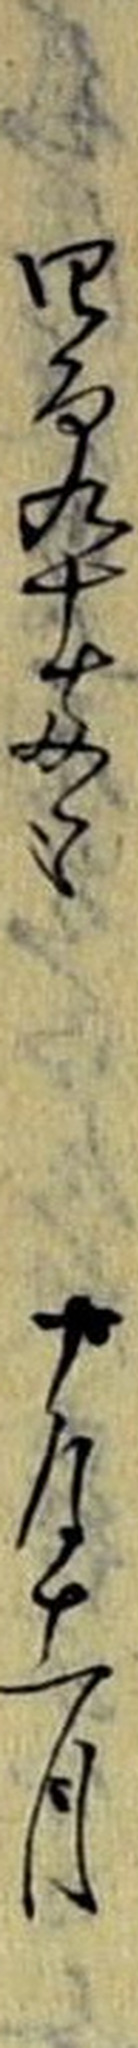四百九十両つヽ十月十一月
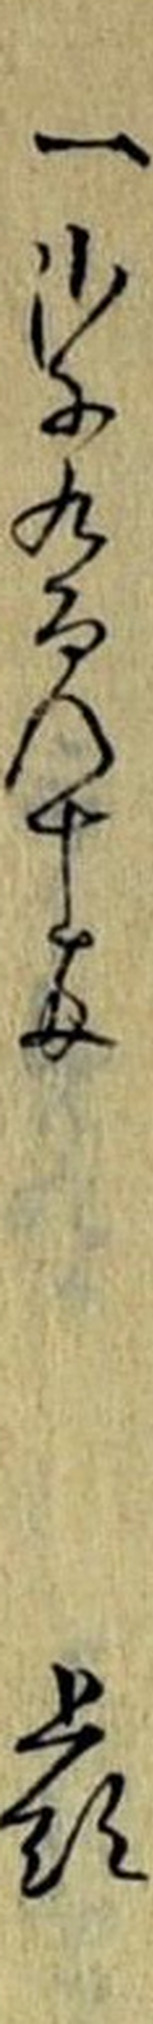一弐千九百八十両上領
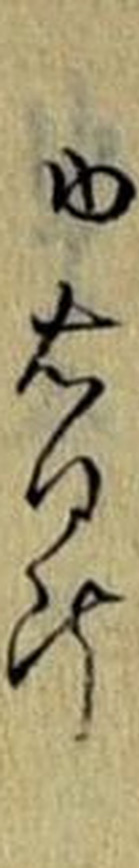内右同断
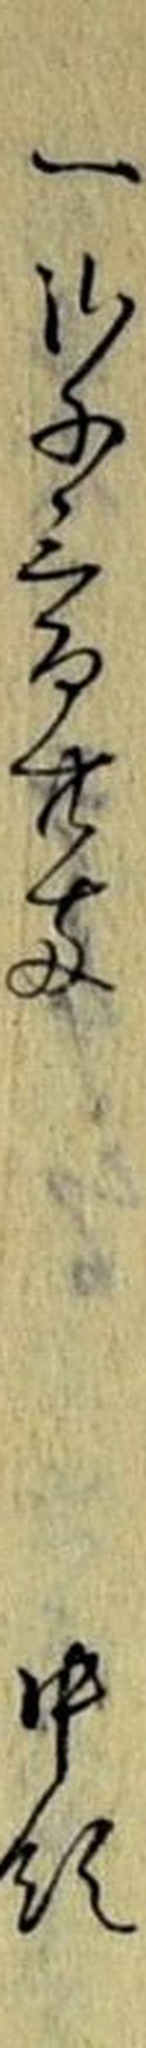一弐千三百廿両中領
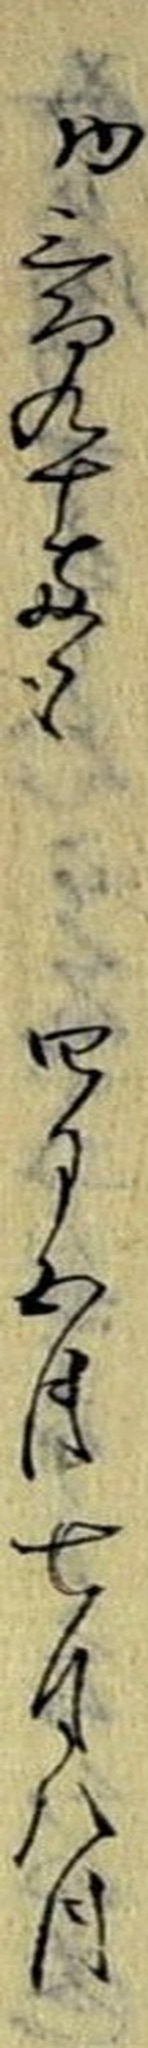内三百九十両つヽ四月五月七月八月
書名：命令之部 四
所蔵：福井県文書館 Fukui Prefectural Archives
